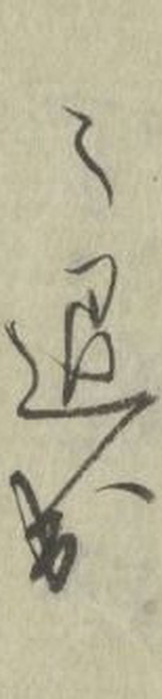々退出
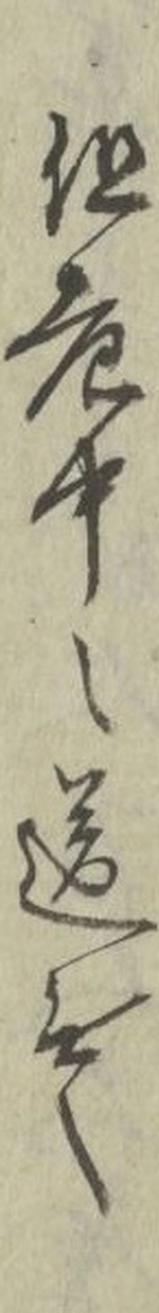但老中之送無之
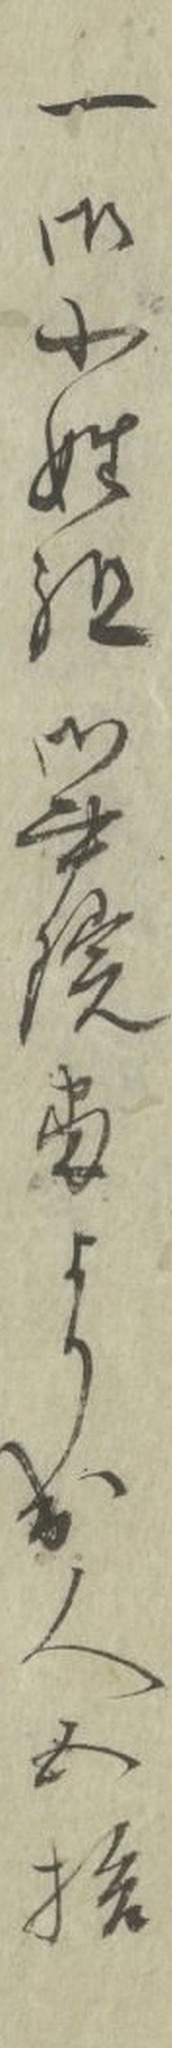一御小姓組御書院番より出人五拾

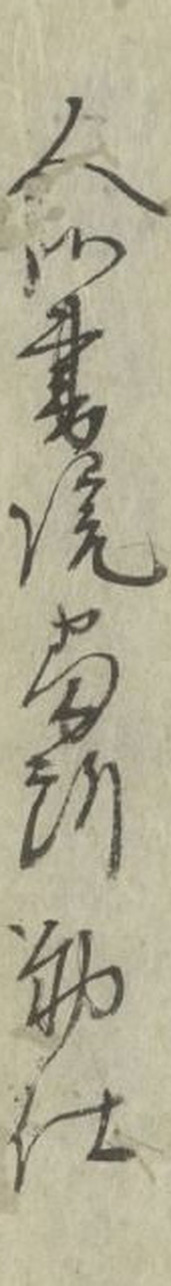人御書院番所勤仕
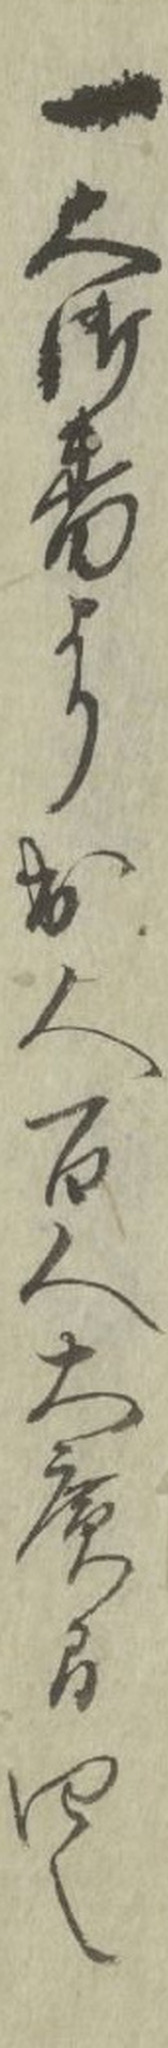一大御番より出入百人大広間四之
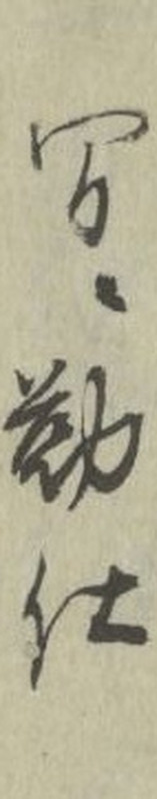間に勤仕
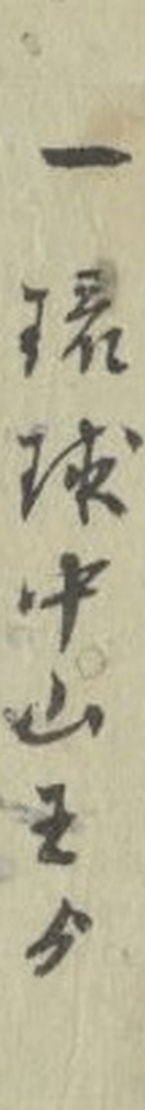一琉球中山王ゟ
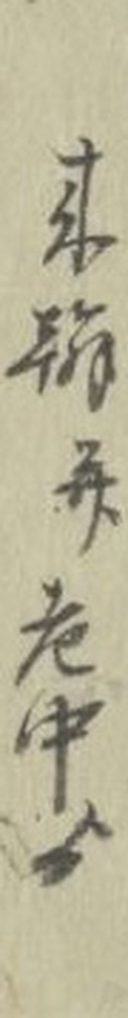来翰幷老中ゟ
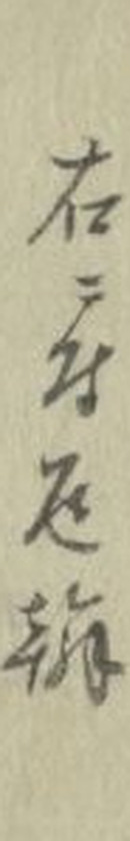右に付返翰

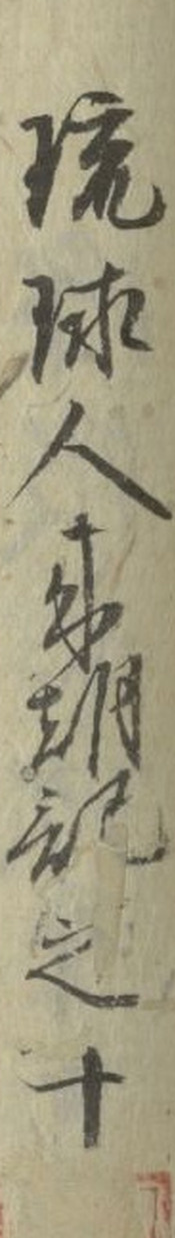琉球人来朝記之十
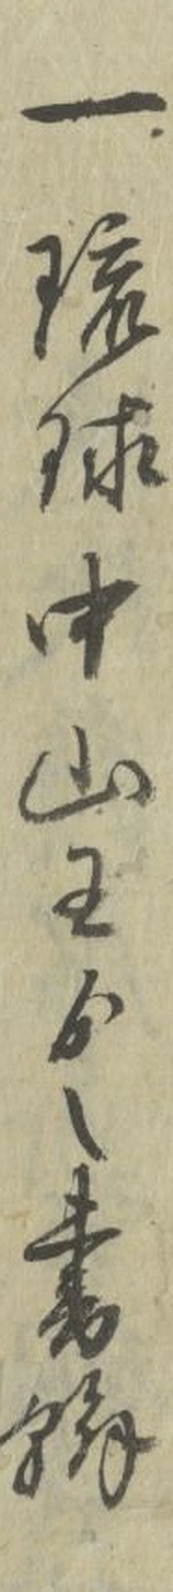一琉球中山王ゟ之書翰
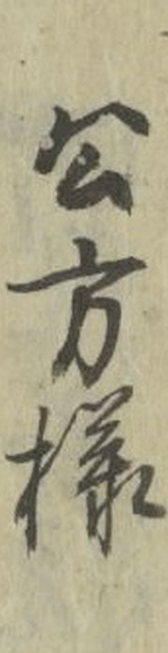公方様

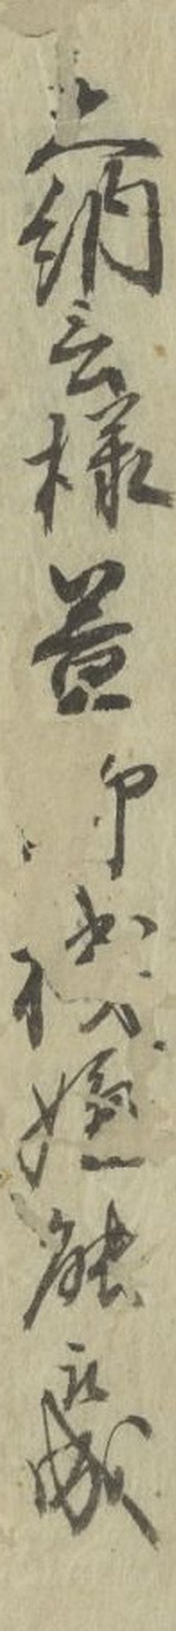大納言様益御機嫌能被成
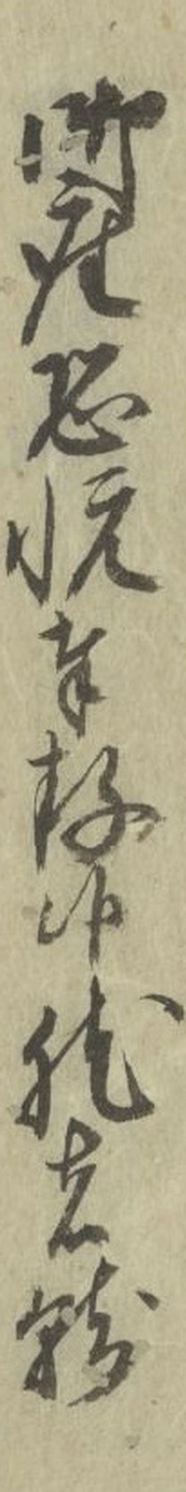御座恐悦奉存候然者就
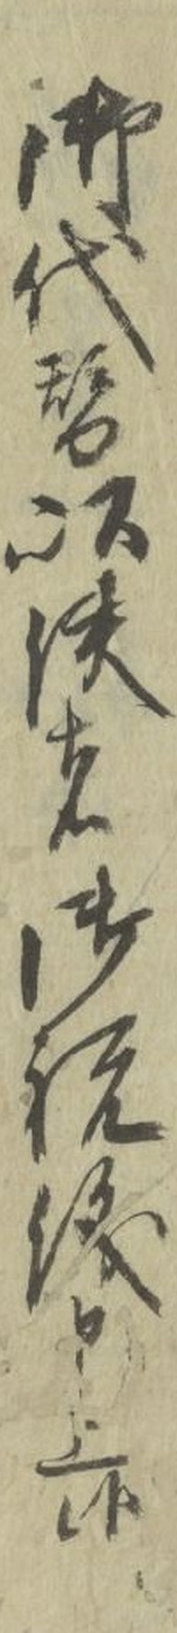御代替以使者御祝儀申上候
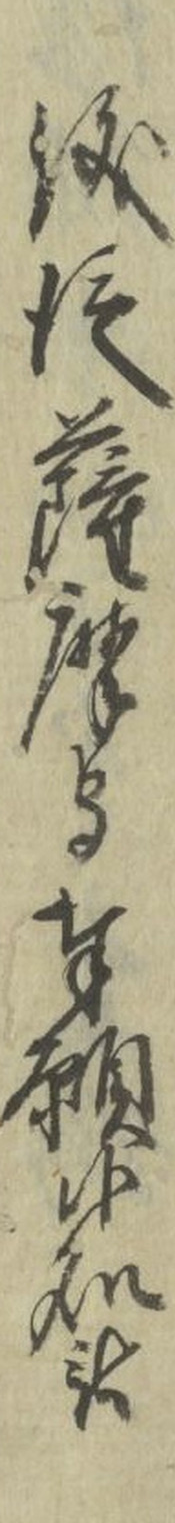儀従薩摩守奉願候処被
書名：琉球来朝記 自八至十四終
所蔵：University of the Ryukyus Library
